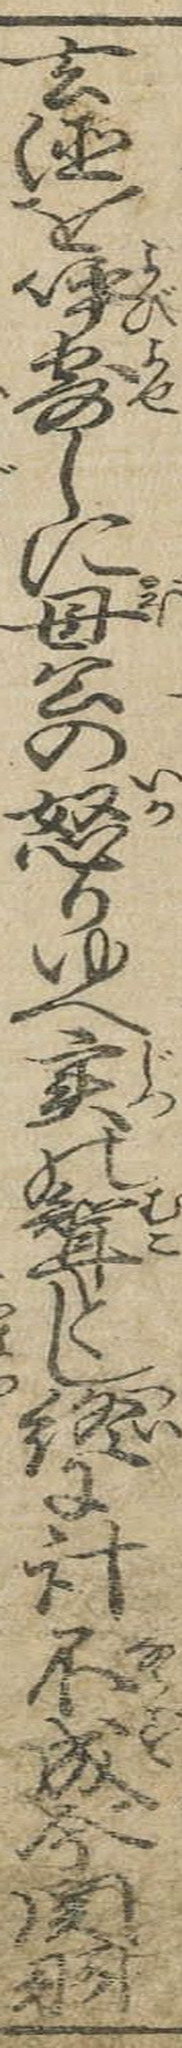玄徳を呼寄しに。母公の怒りゆへ実の婿とし終に計不成今関羽
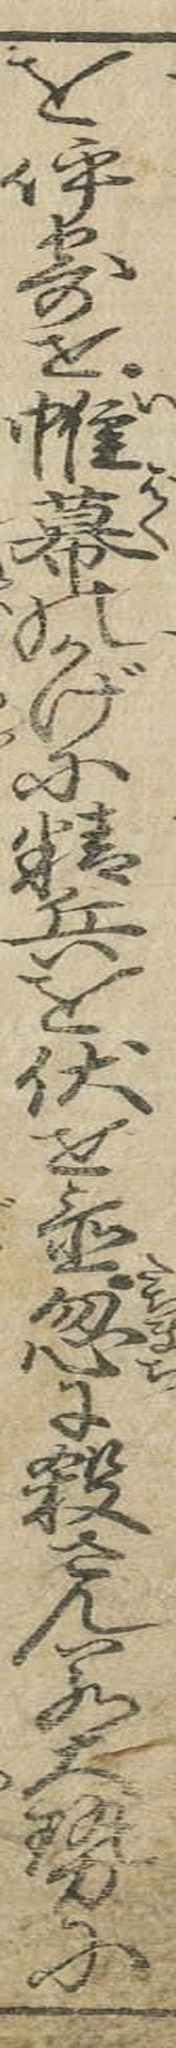を呼寄せ。帷幕のかげに精兵を伏せ置。忽に殺さん若大勢に
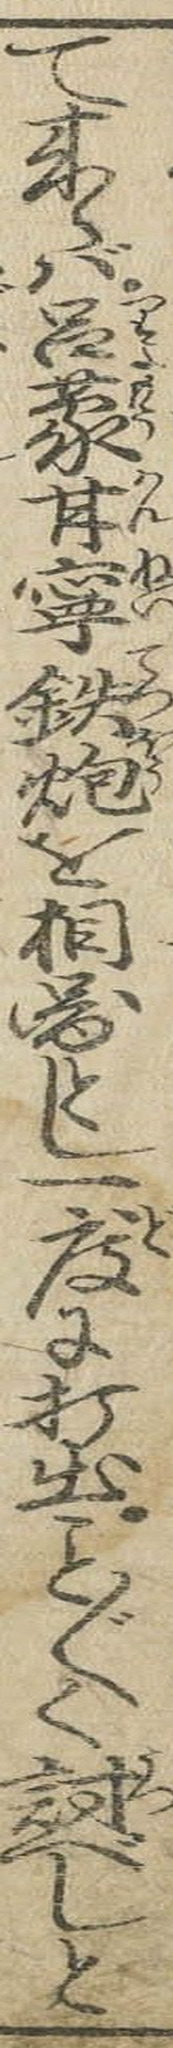て来らば。呂蒙甘寧鉄炮を相図とし一度に打出。こと〴〵く討べしと
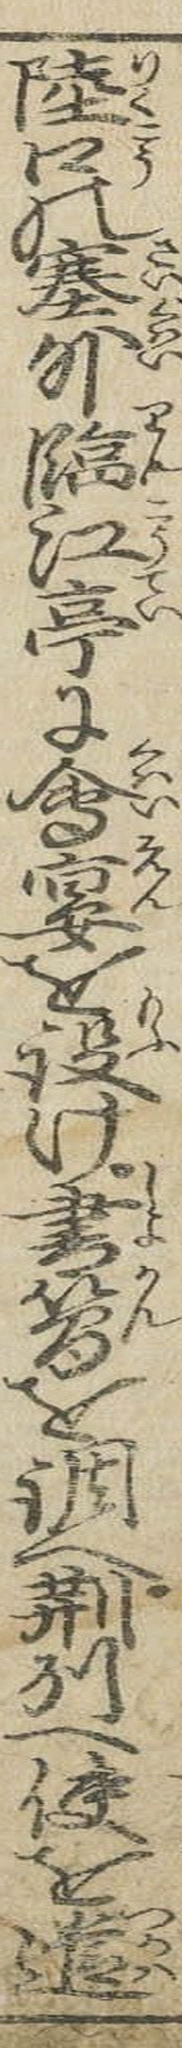陸口の塞外臨江亭に会宴を設け。書簡を調へ。荊州へ使を遣
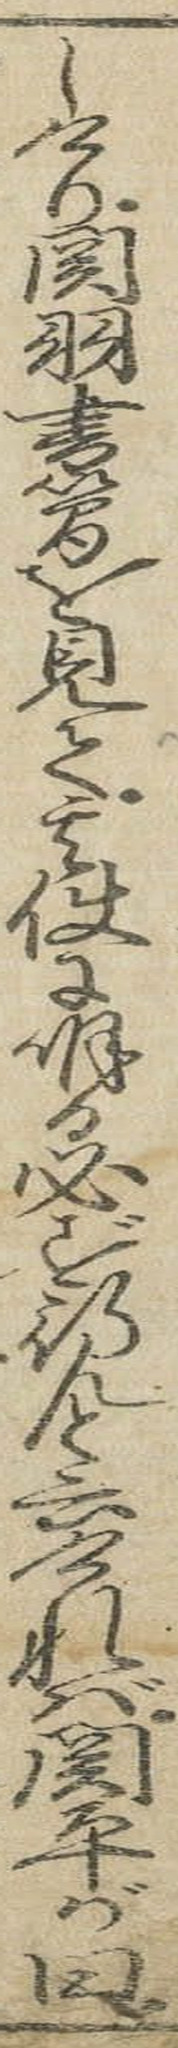しけり。関羽書簡を見て。其使に明日必ず行んと云ければ。関平が曰。
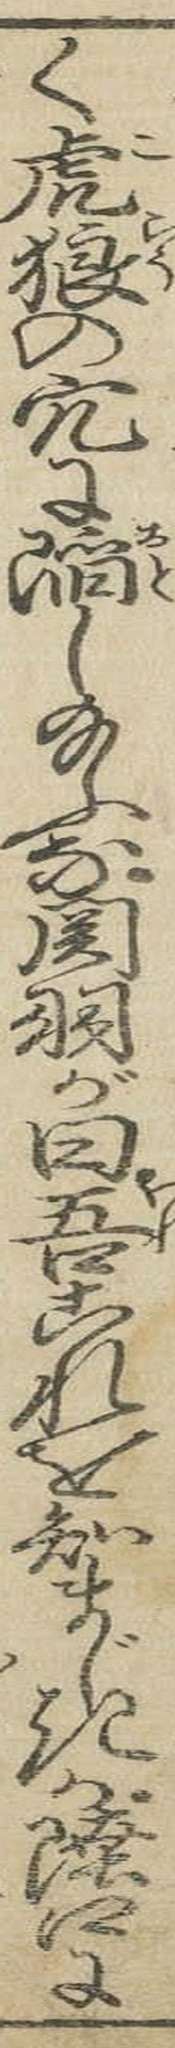く虎狼の穴に陥し給ふな。関羽が曰。吾これを知まじきか。陸口に
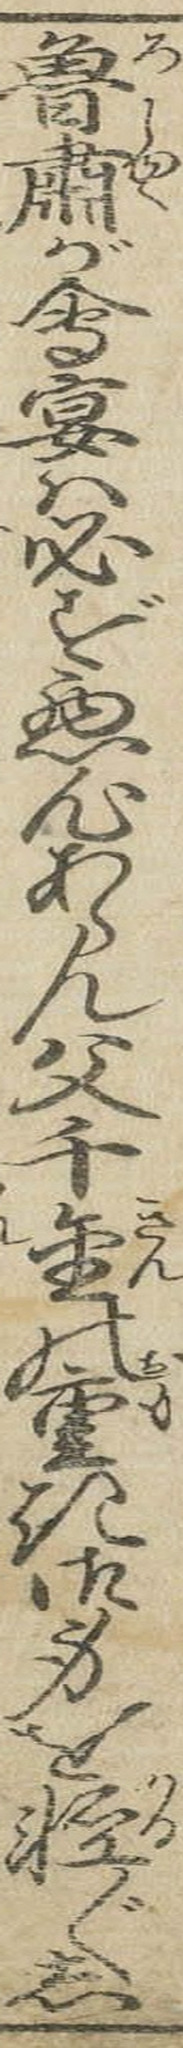魯粛が会宴は必ず悪心あらん父千金の重き御身を軽〴〵し
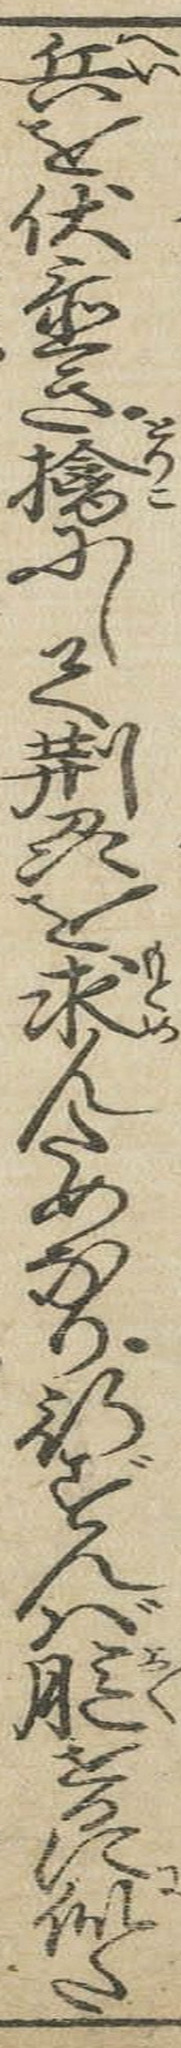兵を伏置き。擒にして荊州を求んためなり。行ずんば臆せるに似た
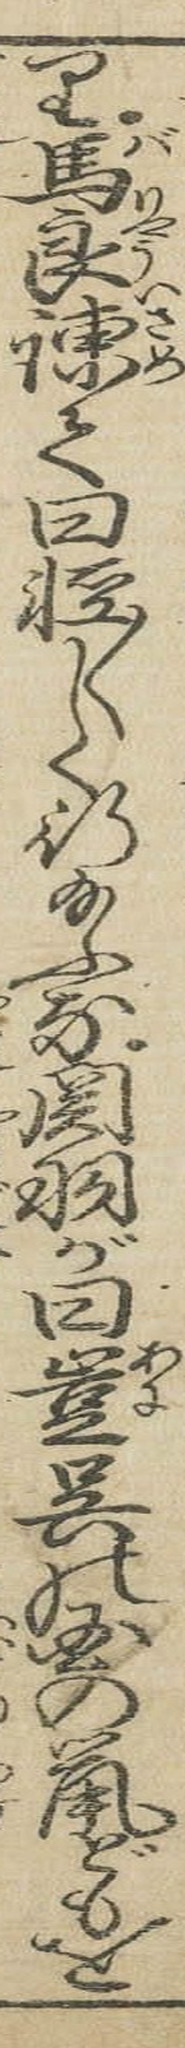り。馬良諫て曰軽〳〵しく行給ふな。関羽が曰豈呉の国の鼠どもを
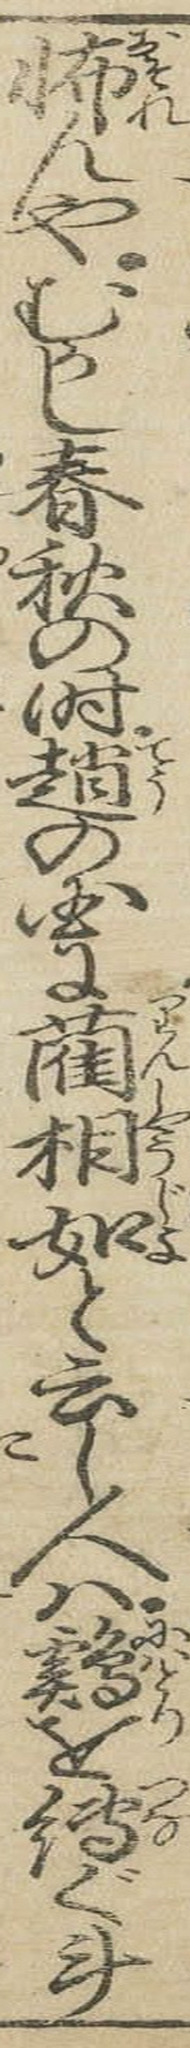怖んや。むかし春秋の時。趙の国に藺相如と云し人は。鶏を縛ぐ計
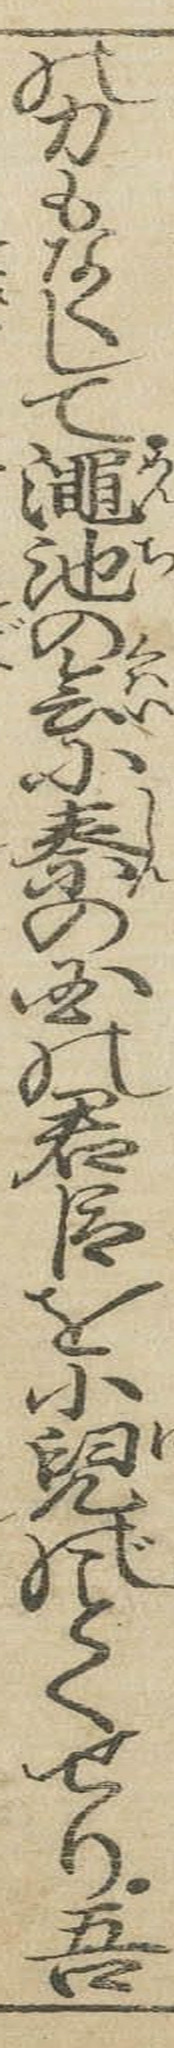の力もなくして。澠池の会に秦の国の君臣を小児のごとくせり。吾
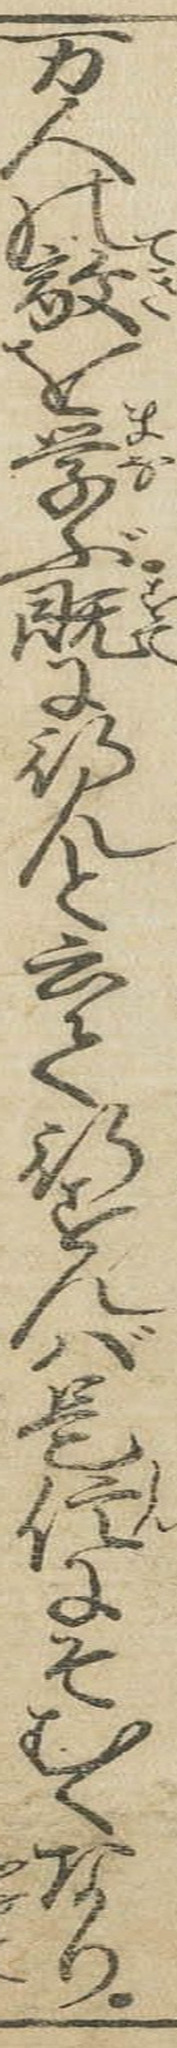万人の敵を学ぶ。既に行んと云て行すんば是信にそむくなり。
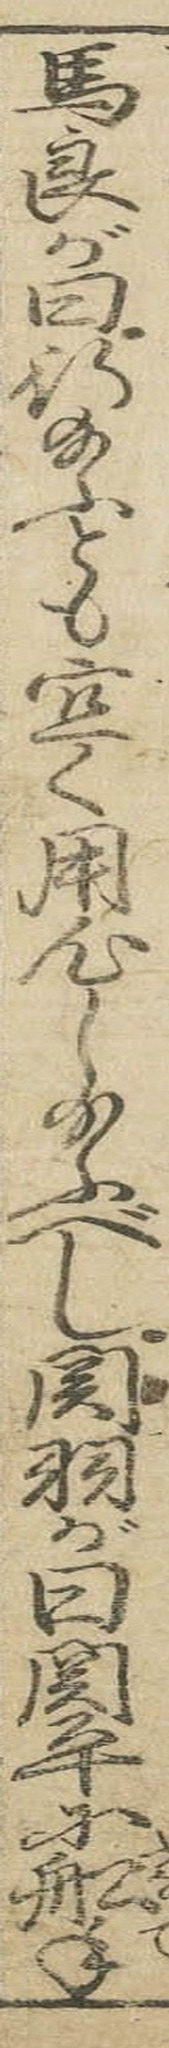馬良が曰。行給ふとも宜く用心し給ふべし。関羽が曰関平に船手
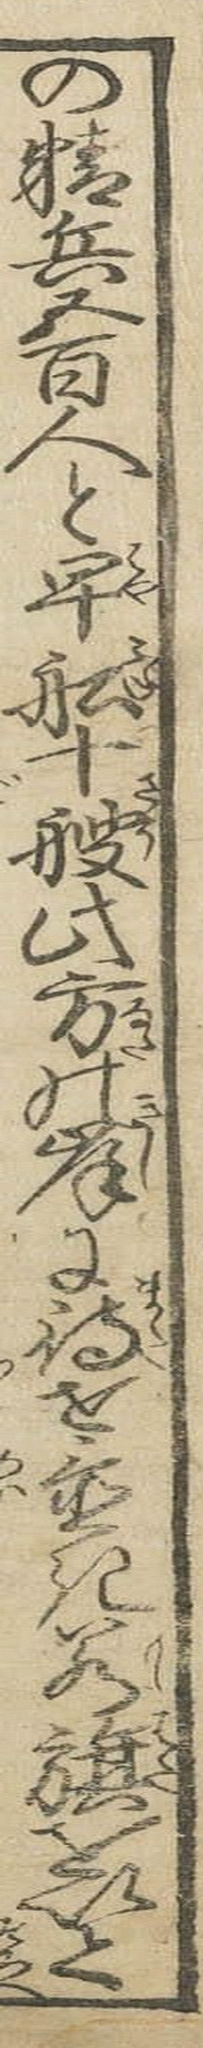の精兵五百人と早船十艘此方の岸に待せ置き若旗を以て
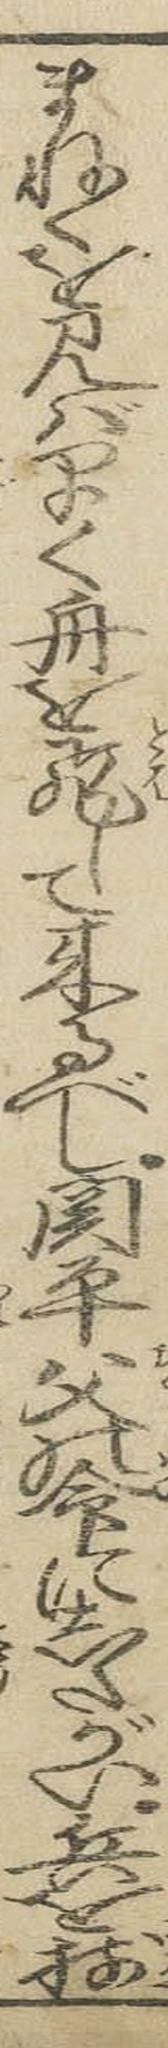まねくを見ば早く舟を飛して来るべし。関平父の命にしたがい。兵を揃
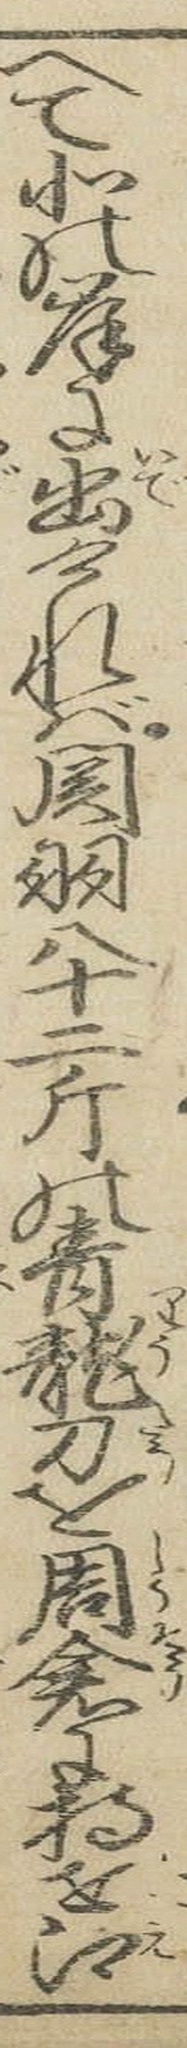へて北の岸に出ければ。関羽八十二斤の青龍刀を周倉に持せ江
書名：絵本写宝袋 9巻 7之巻
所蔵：東京学芸大学教育コンテンツアーカイブ
